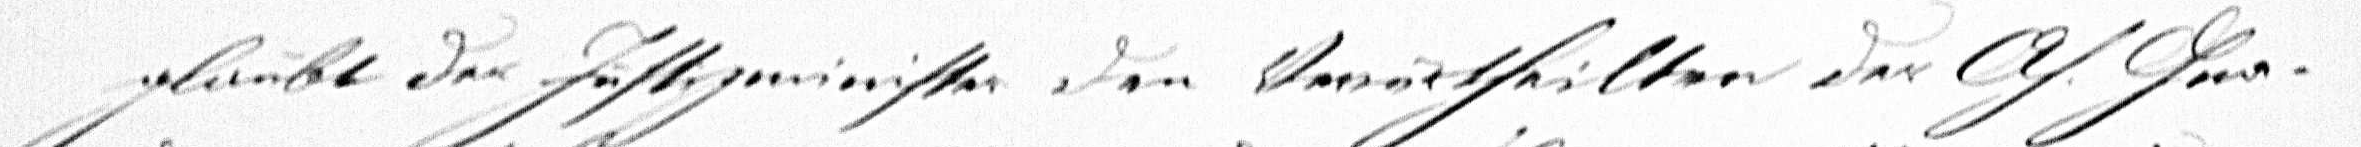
glaubt der Justizminister den Verurtheilten der Ah Gna¬
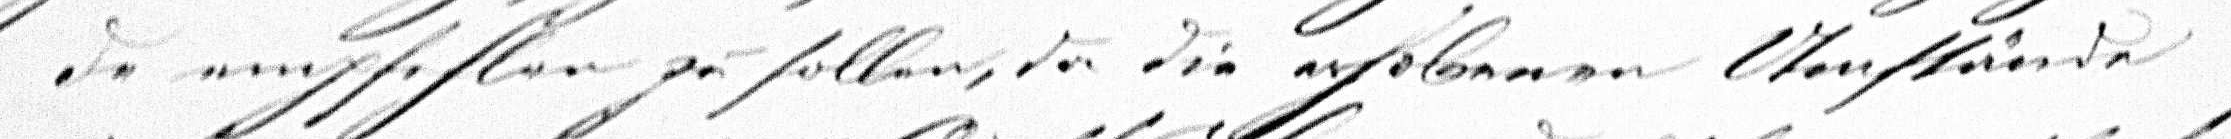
de empfehlen zu sollen, da die erhobenen Umstände
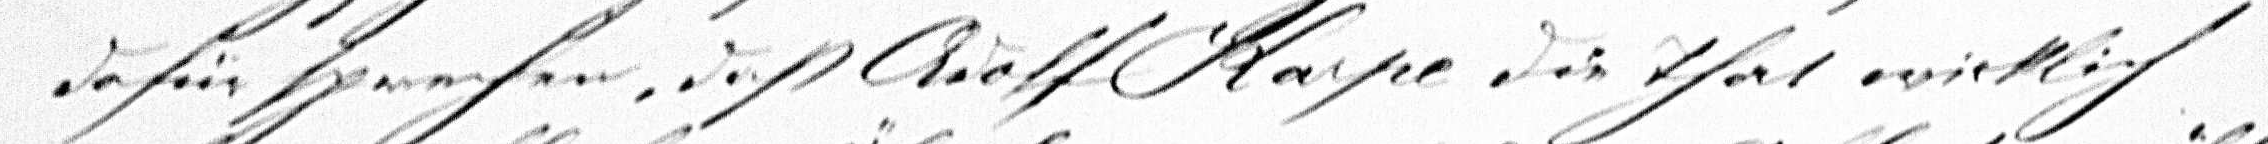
dafür sprachen, daß Adolf Karpe die That wirklich
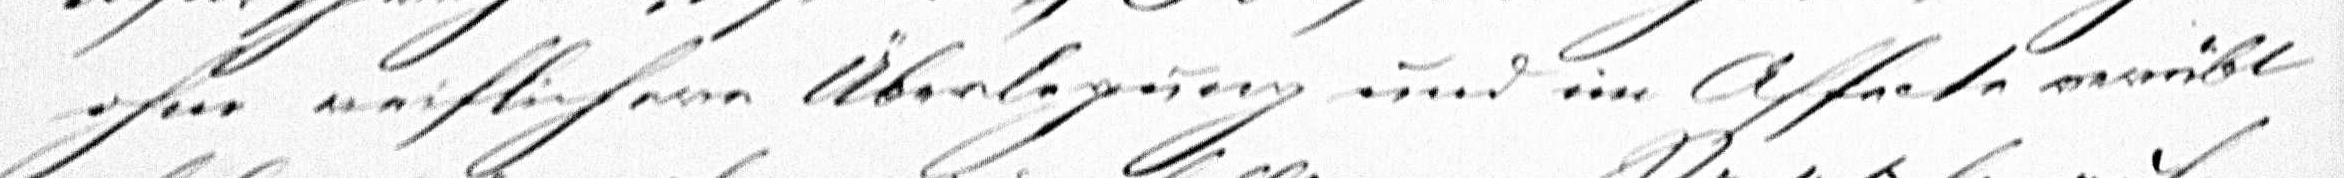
ohne reiflichere Überlegung und im Affecte verübt
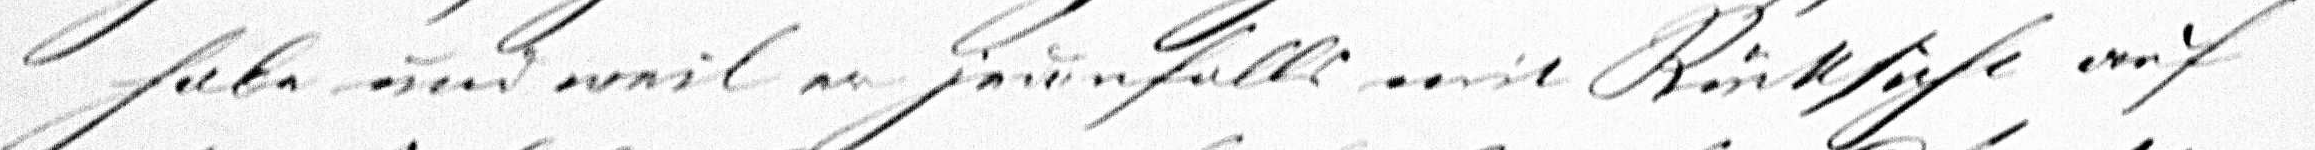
habe und weil er jedenfalls mit Rücksicht auf
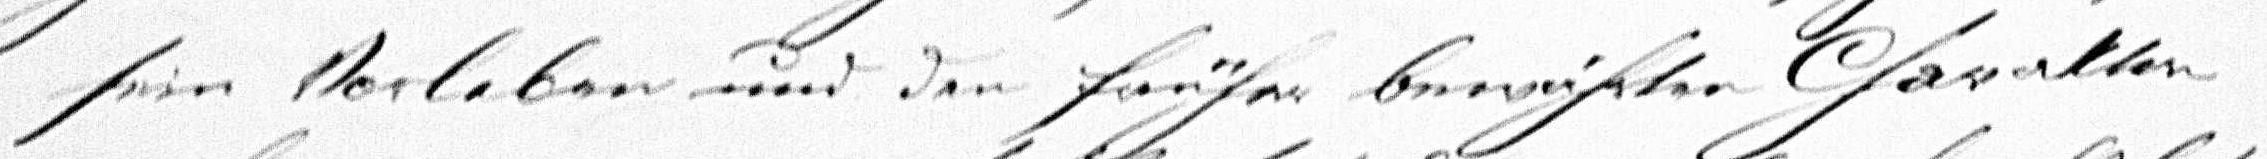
sein Vorleben und den früher bewährten Charakter
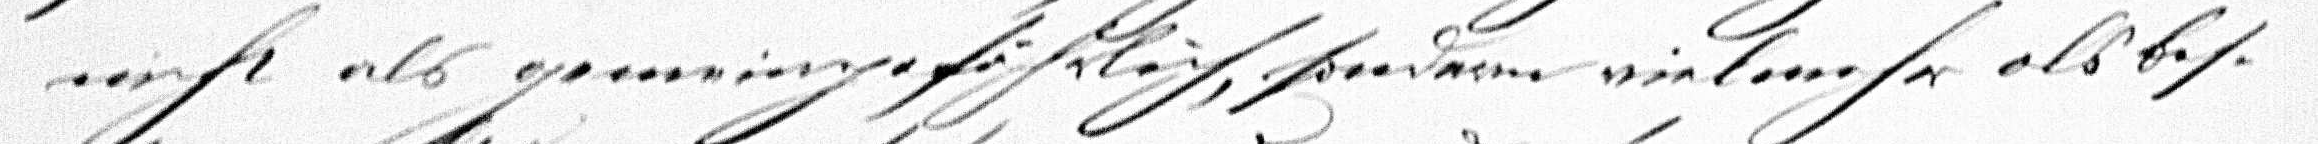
nicht als gemeingefährlich, sondern vielmehr als bes¬
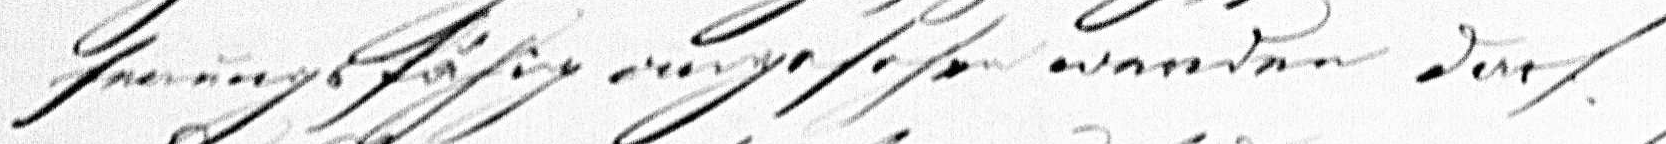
serungsfähig angesehen werden darf.
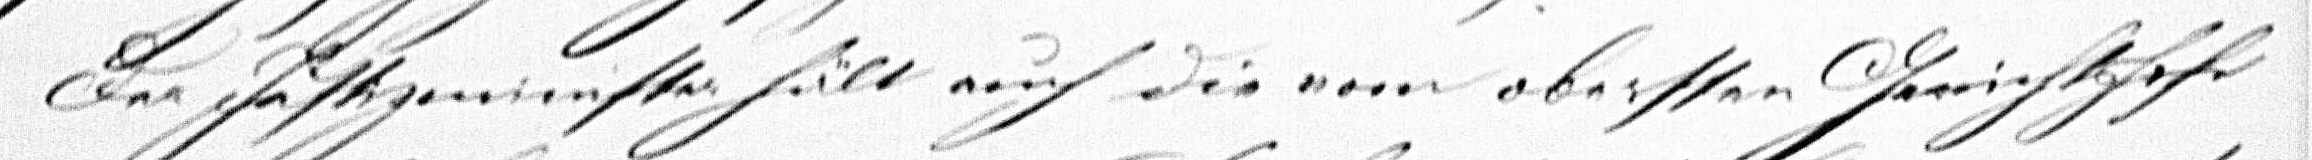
Der Justizminister hält auch die vom obersten Gerichtshofe
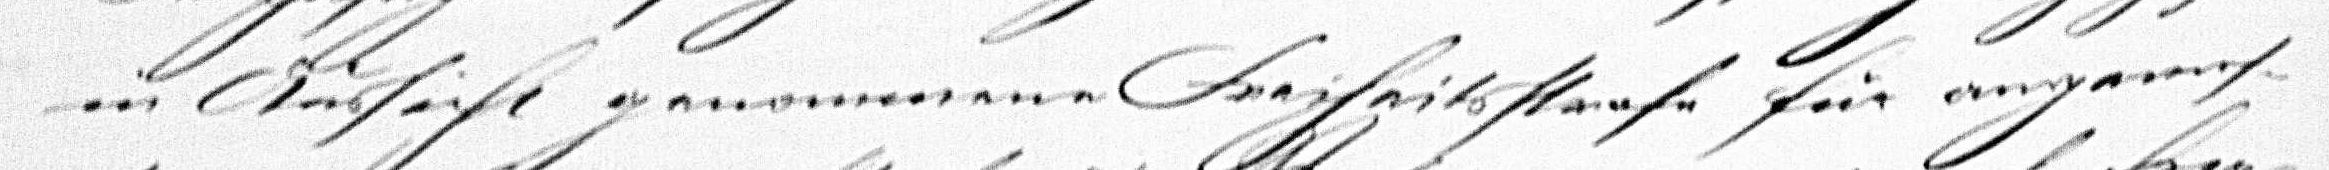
in Aussicht genommene Freiheitsstrafe für angemes¬
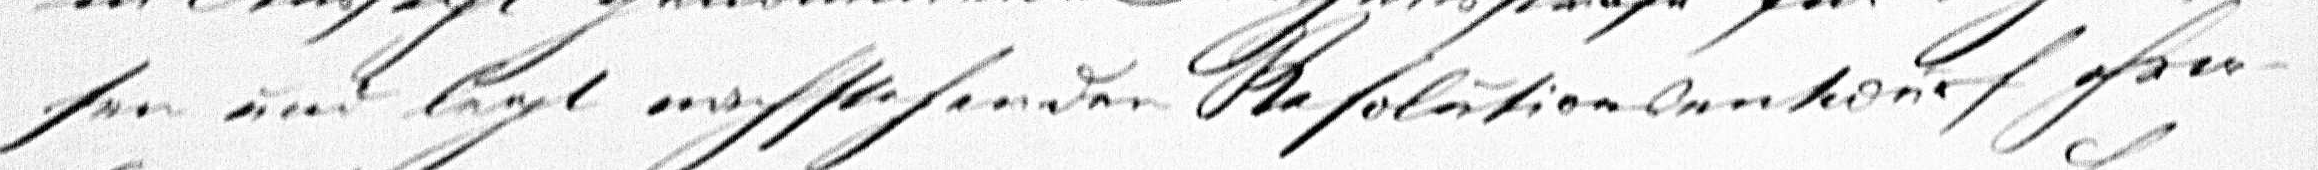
sen und liegt nachstehenden Resolutionsentwurf ehr¬
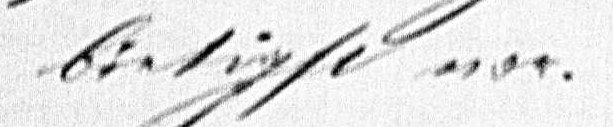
bietigst vor.
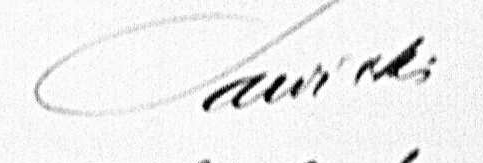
Sawicki
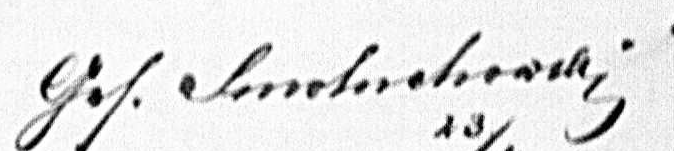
Ges. Smolechowski
